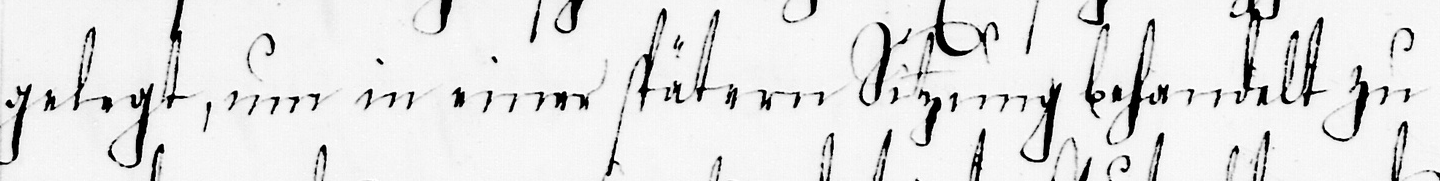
gelegt, um in einer spätern Sitzung behandelt zu
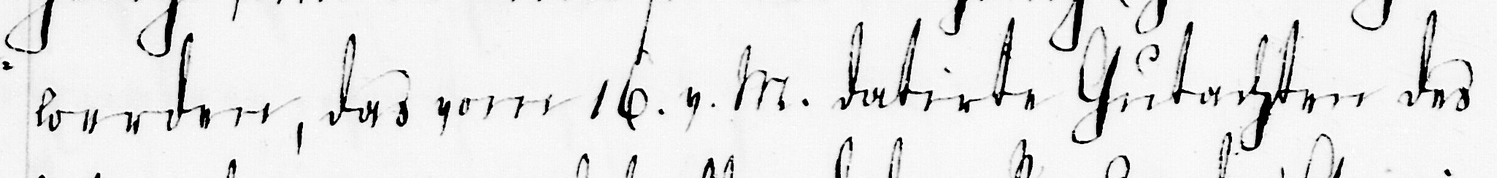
werden, das vom 16. v. M. datirte Gutachten des
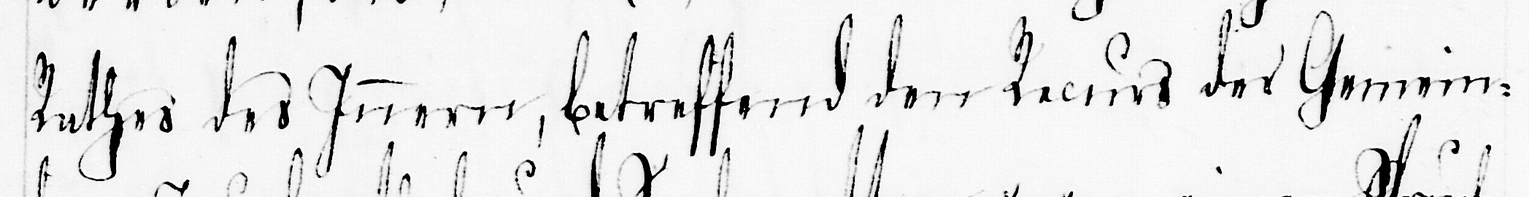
Rathes des Innern, betreffend den Recurs der Gemein¬
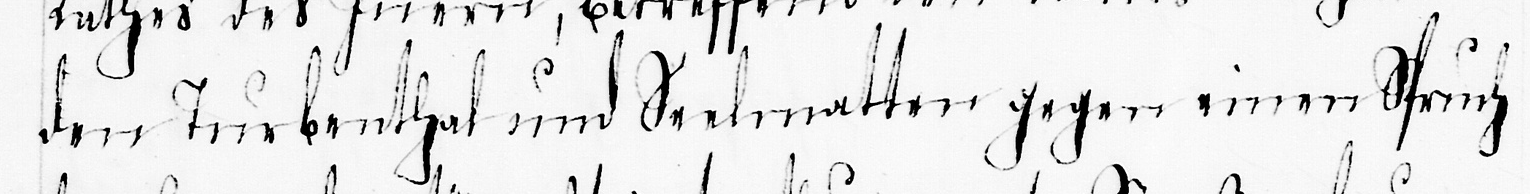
den Turbenthal und Seelmatten gegen einen Spruch
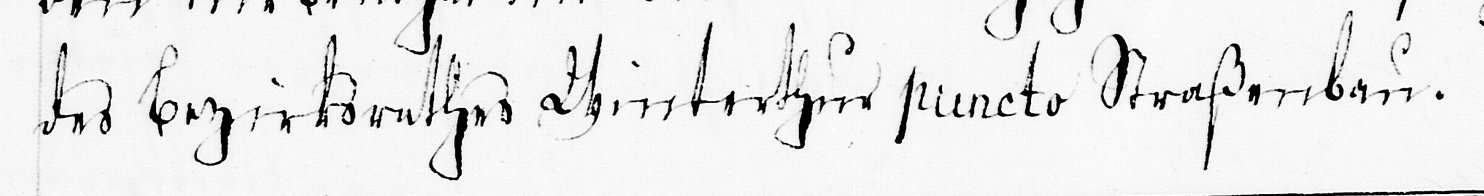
des Bezirkrathes Winterthur puncto Straßenbau.
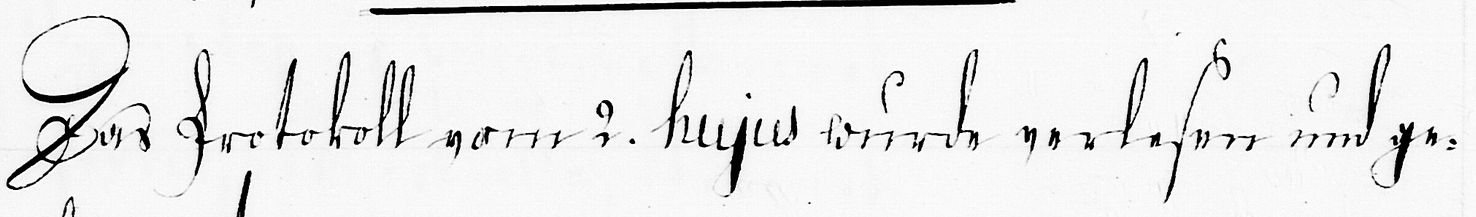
Das Protokoll vom 2. hujus wurde verlesen und ge¬
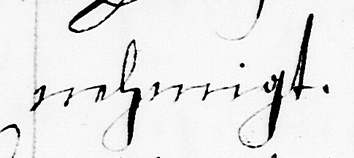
nehmigt.
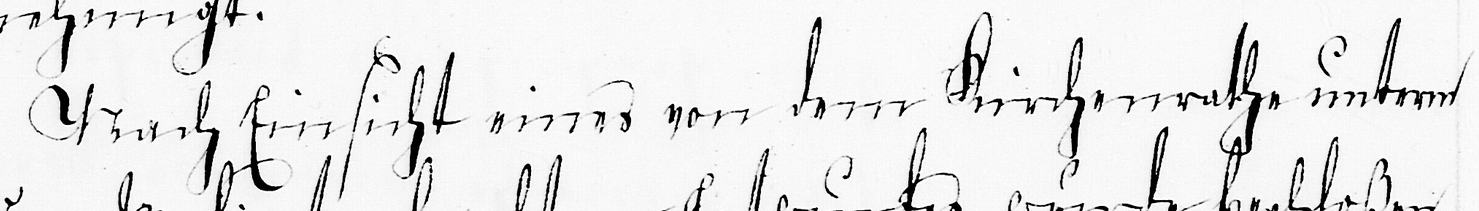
Nach Einsicht eines von dem Kirchenrathe unterm
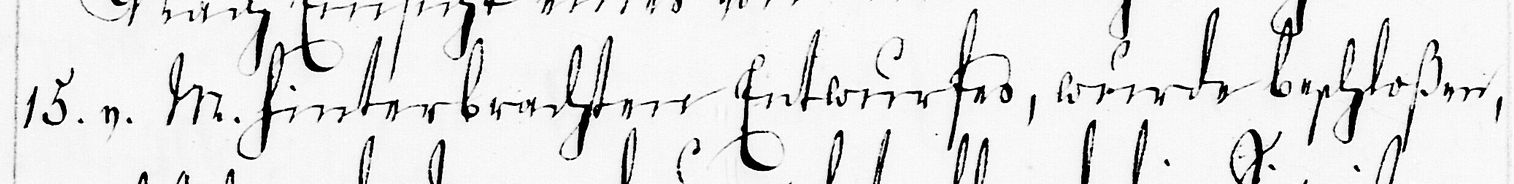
15. v. M. hinterbrachten Entwurfes, wurde beschloßen,
